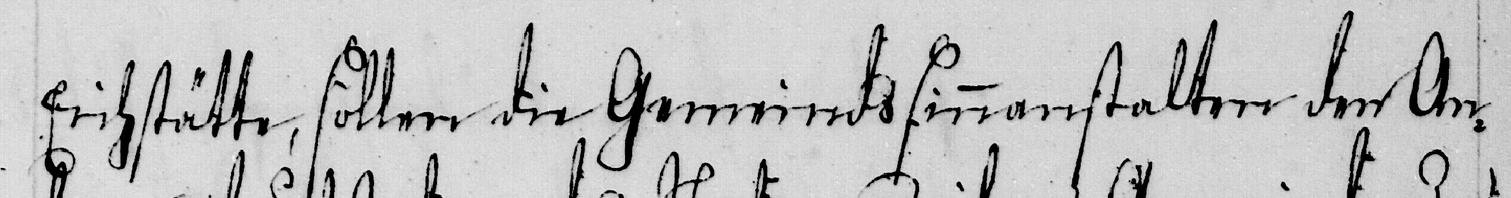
Eichstätte, sollen die Gemeindssinnanstalten den An¬
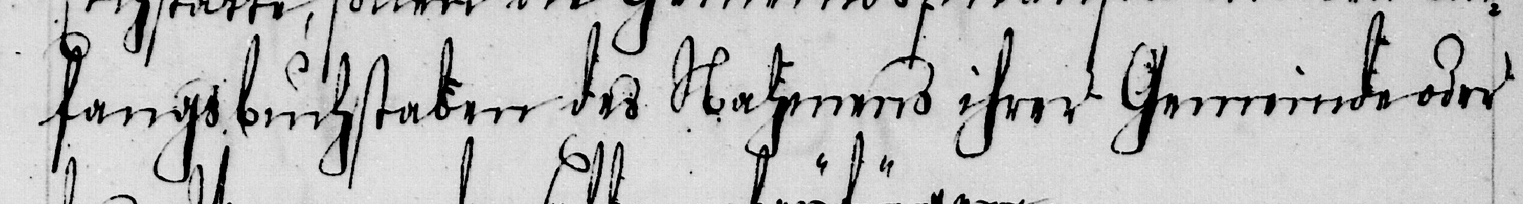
fangsbuchstaben des Nahmens ihrer Gemeinde oder
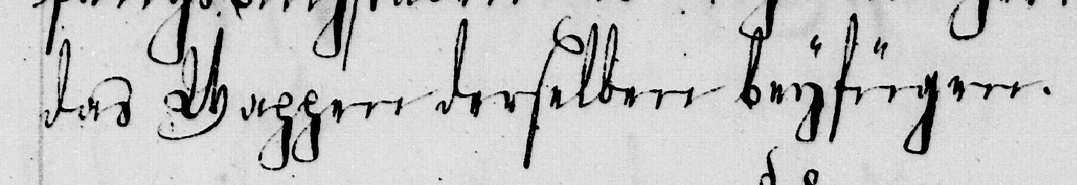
das Wappen derselben beyfügen.
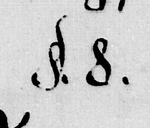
§. 8.
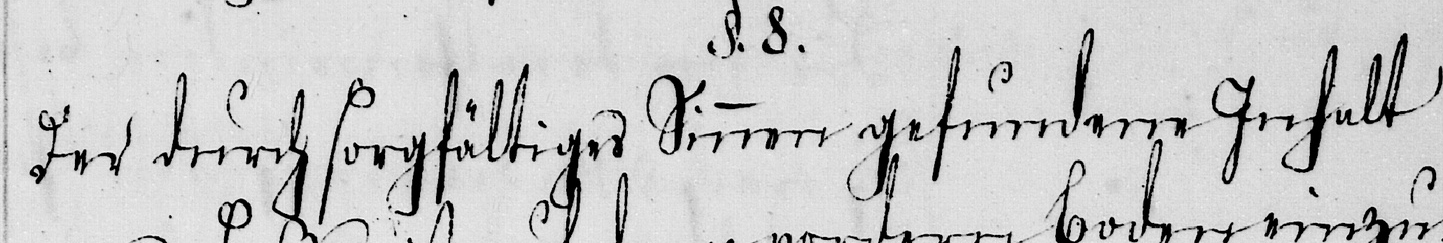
Der durch sorgfältiges Sinnen gefundene Inhalt
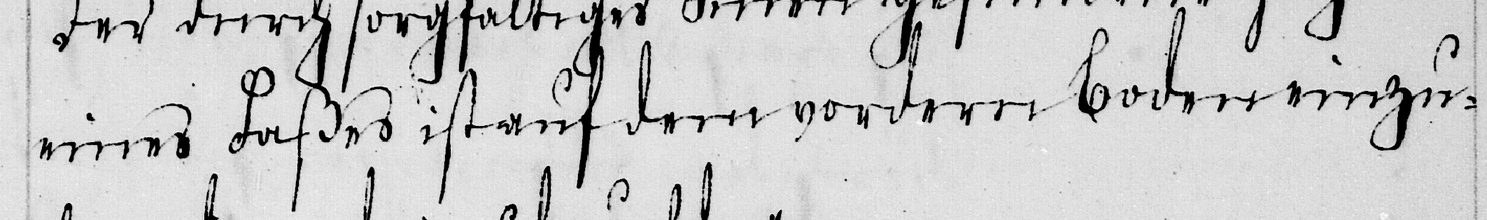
eines Faßes ist auf dem vordern Boden einzu¬
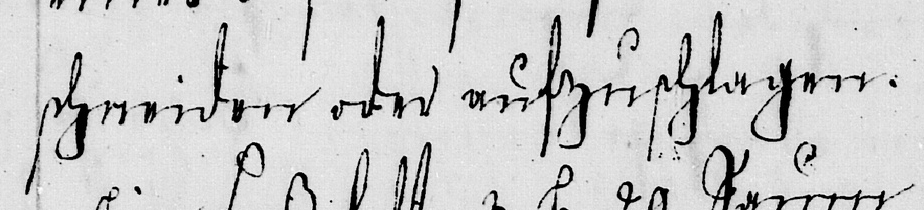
schneiden oder aufzuschlagen.
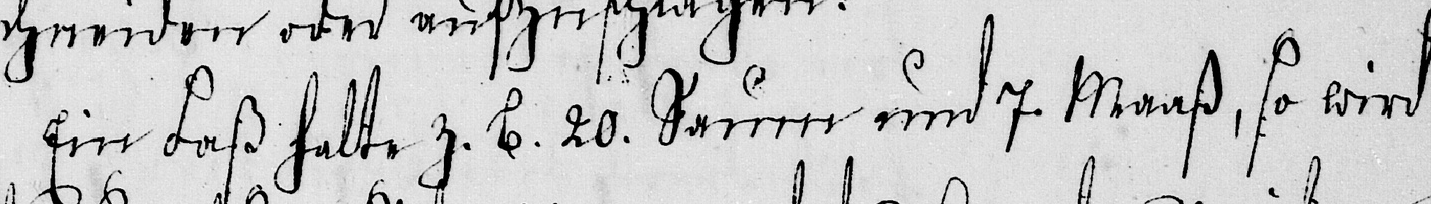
Ein Faß halte z. B. 20. Saum und 7. Maaß, so wird
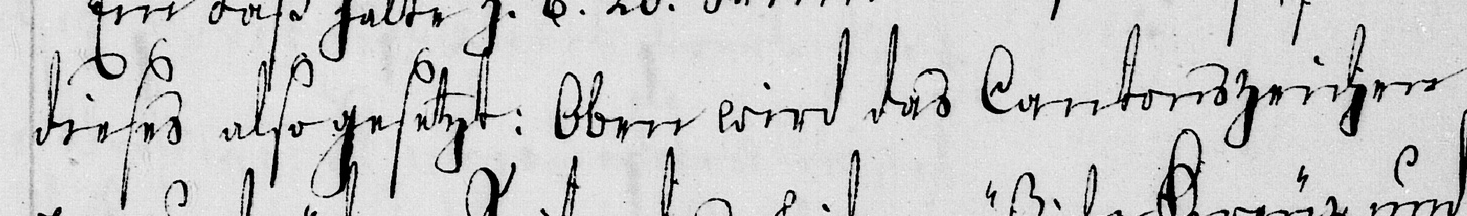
dieses also gesetzt: Oben wird das Cantonszeichen
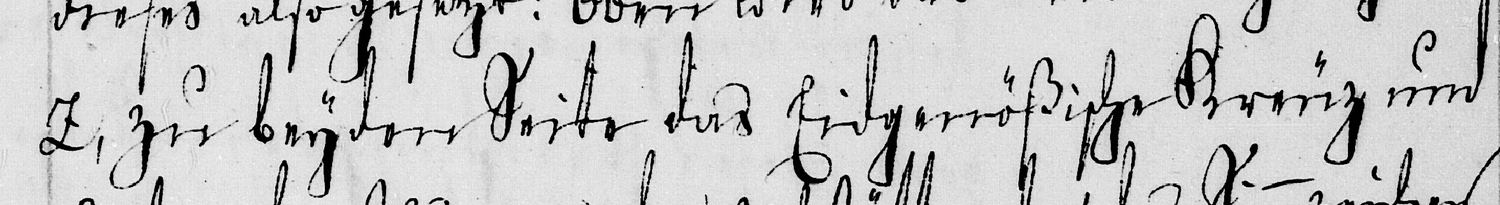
Z, zu beyden Seiten das Eidgenößische Kreuz und
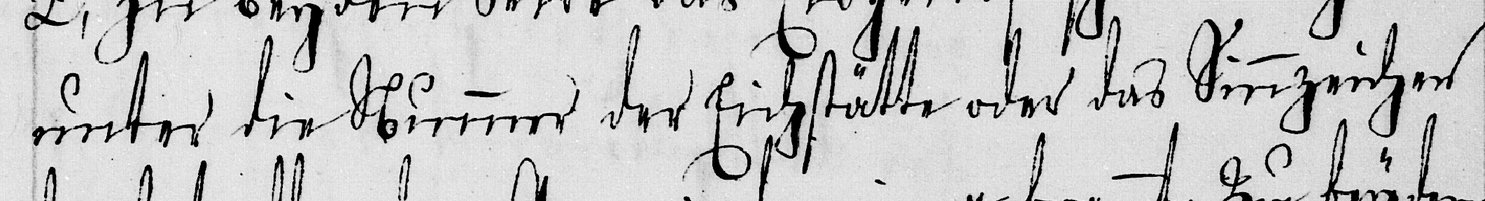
unter die Nummer der Eichstätte oder das Sinnzeichen
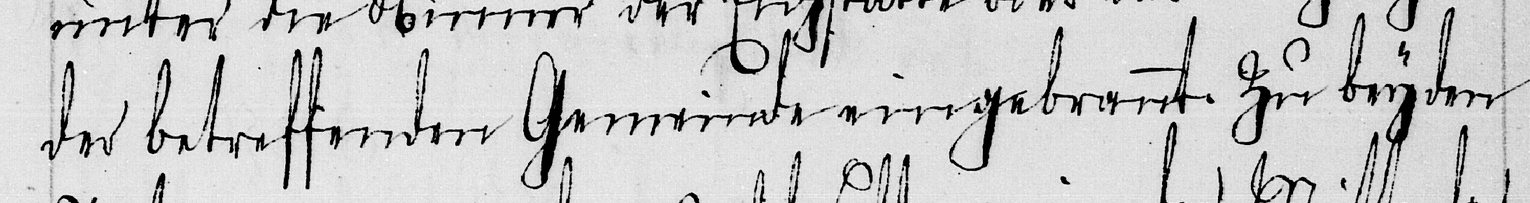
der betreffenden Gemeinde eingebrannt. Zu beyden
